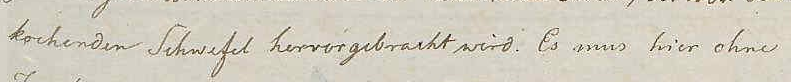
kochenden Schwefel hervorgebracht wird. Es mus hier ohne
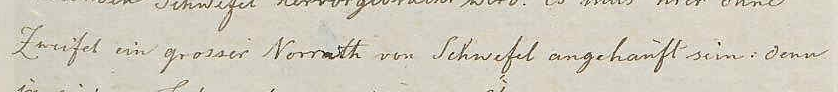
Zweifel ein grosser Vorrath von Schwefel angehäuft sein: denn
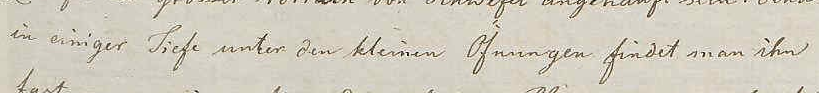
in einiger Tiefe unter den kleinen Öfnungen findet man ihn
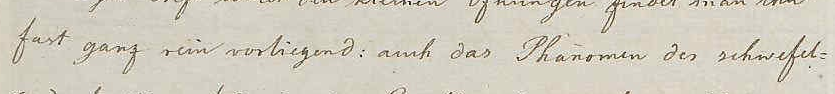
fast ganz rein vorliegend: auch das Phänomen des schwefel-
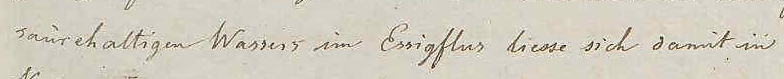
säurehaltigen Wassers in Essigflus liesse sich damit in
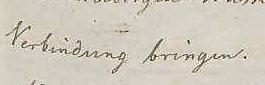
Verbindung bringen.
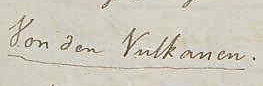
Von den Vulkanen.
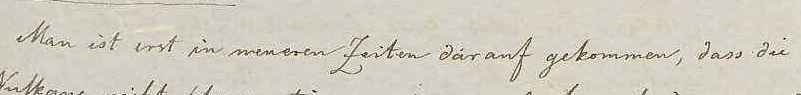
Man ist erst in neueren Zeiten darauf gekommen, dass die
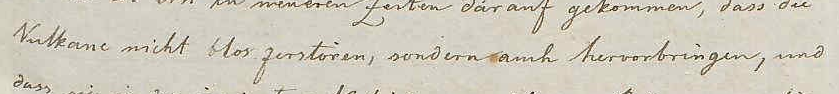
Vulkane nicht blos zerstören, sondern auch hervorbringen, und
